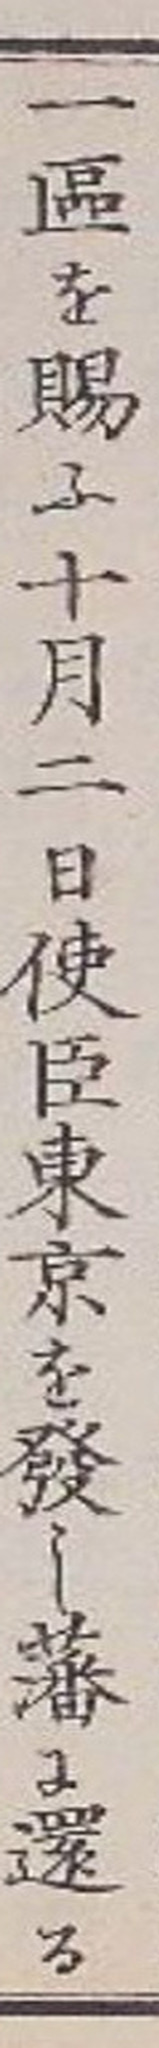一区を賜ふ十月二日使臣東京を発し藩に還る
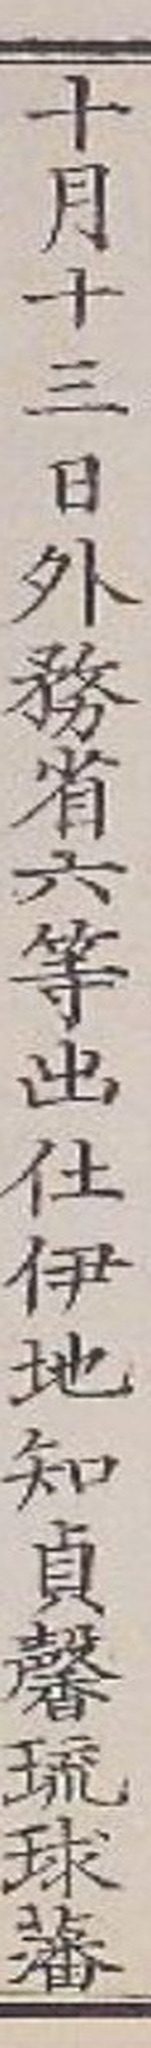十月十三日外務省六等出仕伊地知貞馨琉球藩
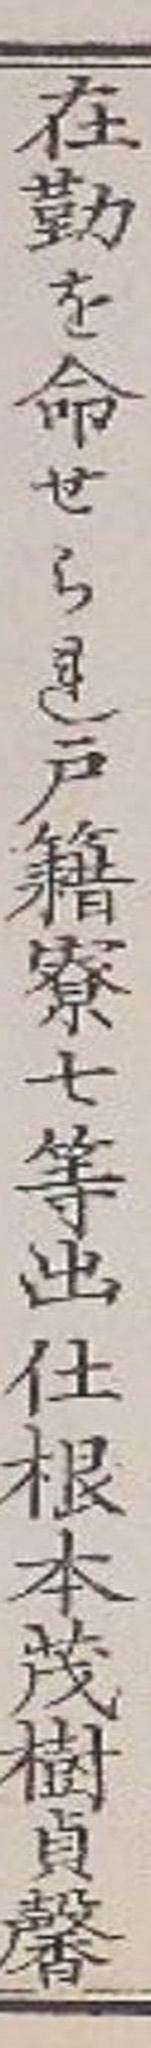在勤を命せられ戸籍寮七等出仕根本茂樹貞馨
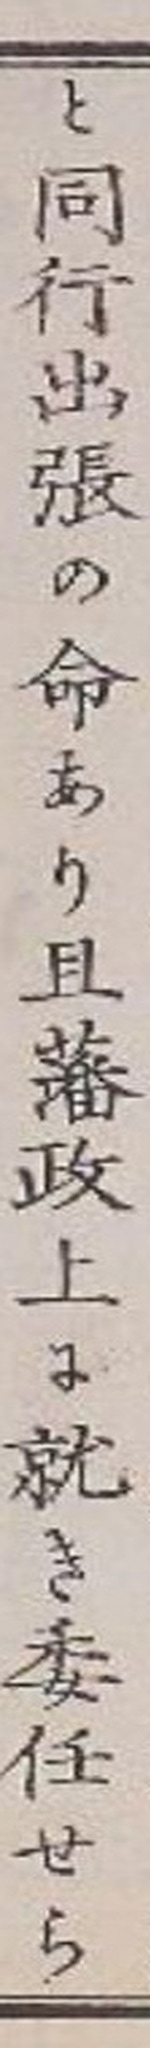と同行出張の命あり且藩政上に就き委任せら
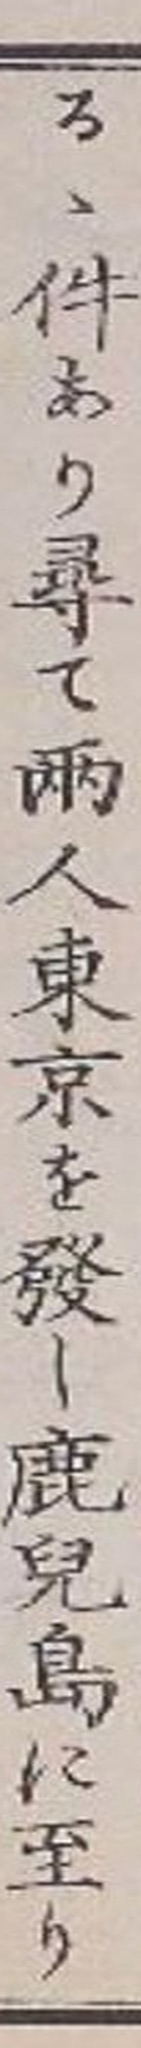るゝ件あり尋て両人東京を発し鹿児島に至り
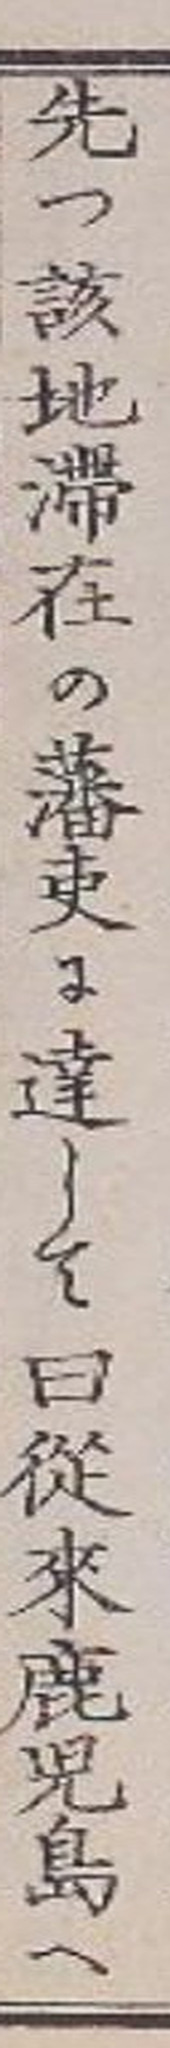先つ該地滞在の藩吏に達して曰従来鹿児島へ

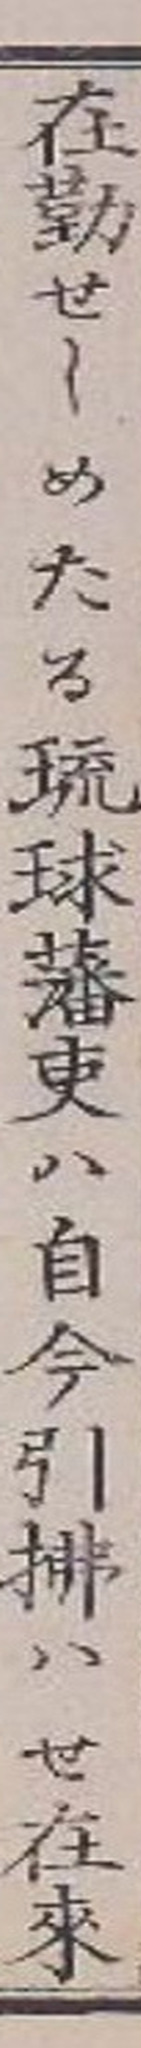在勤せしめたる琉球藩吏は自今引拂はせ在来
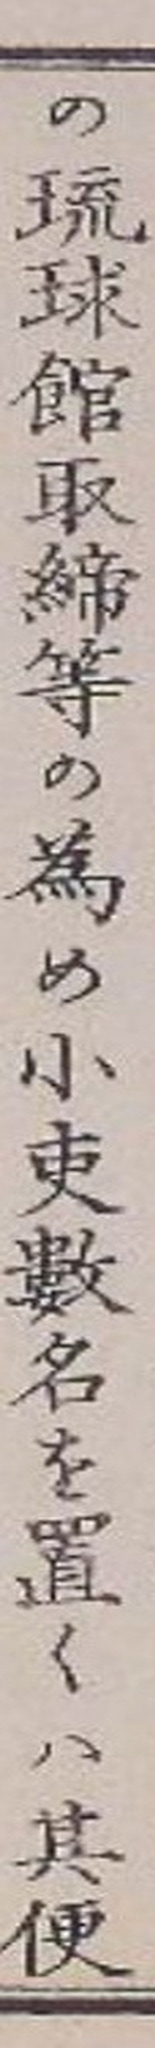の琉球館取締等の為め小吏数名を置くは其便
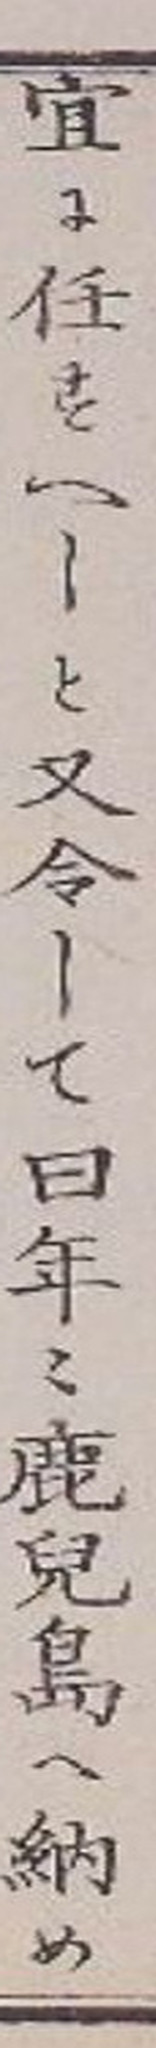宜に任すへしと又令して曰年々鹿児島へ納め
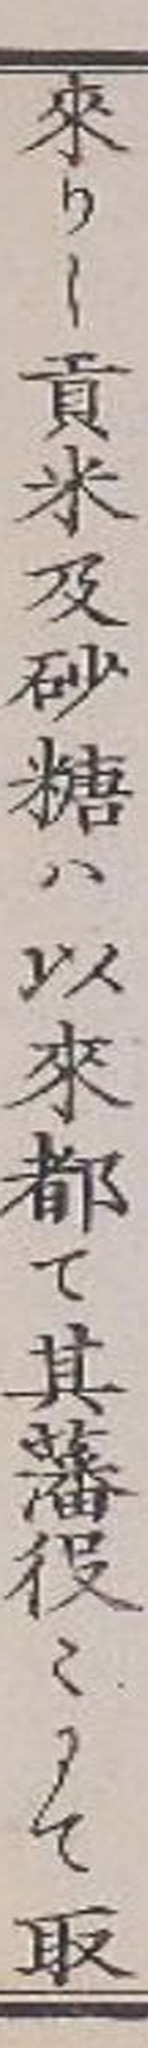来りし貢米及砂糖は以来都て其藩役々にて取
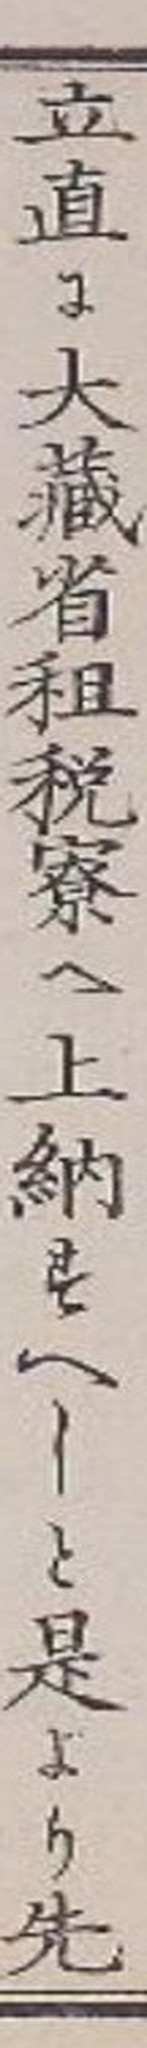立直に大蔵省租税寮へ上納すへしと是より先
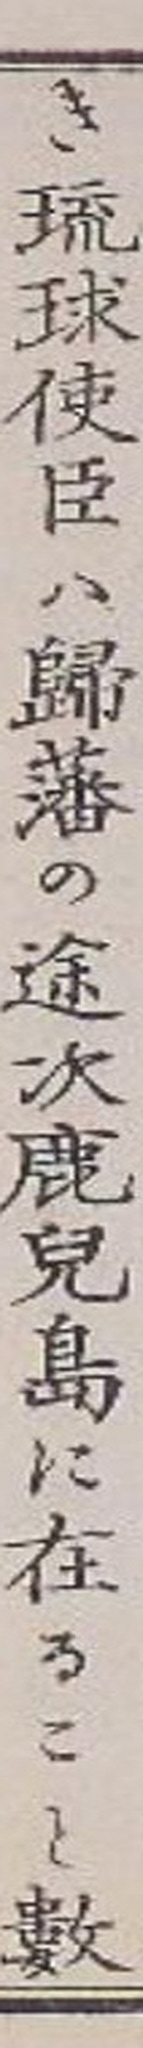き琉球使臣は帰藩の途次鹿児島に在ること数
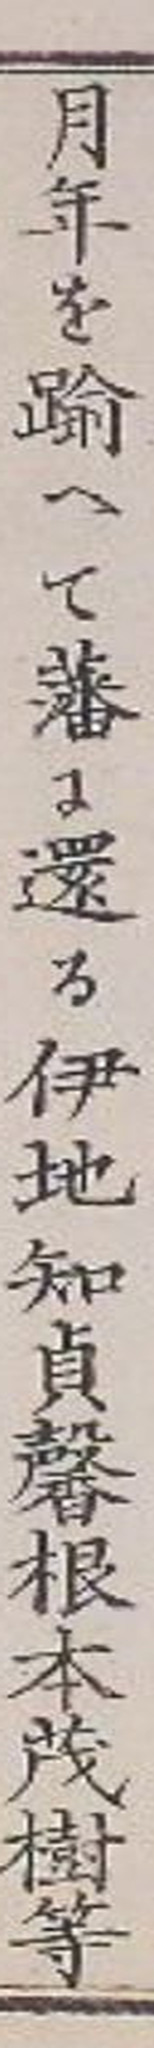月年を踰へて藩に還る伊地知貞馨根本茂樹等
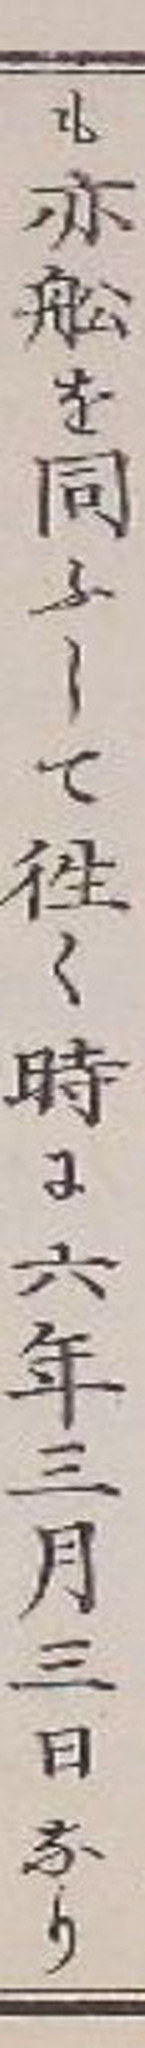も亦船を同ふして往く時に六年三月三日なり
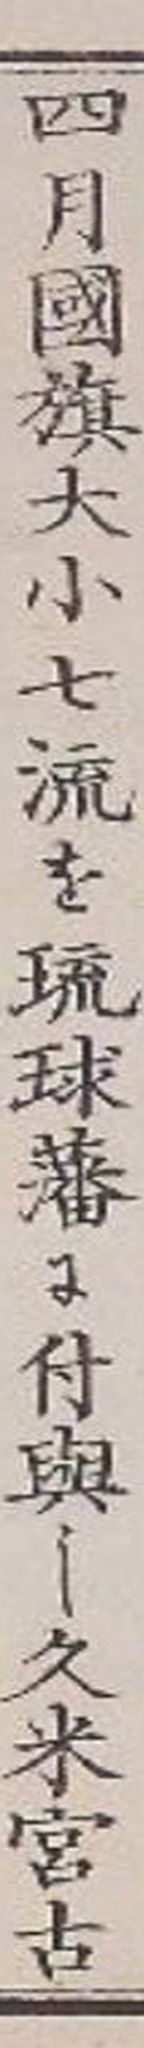四月国旗大小七流を琉球藩に付与し久米宮古
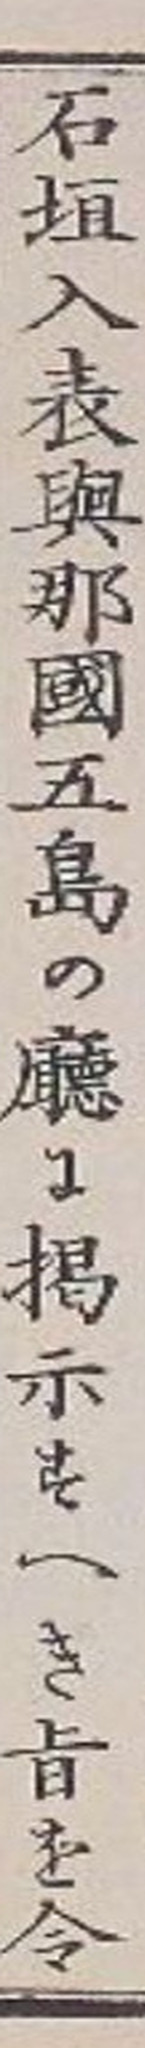石垣入表与那覇五島の廰に掲示すへき旨を令
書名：南島紀事 下
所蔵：University of the Ryukyus Library
